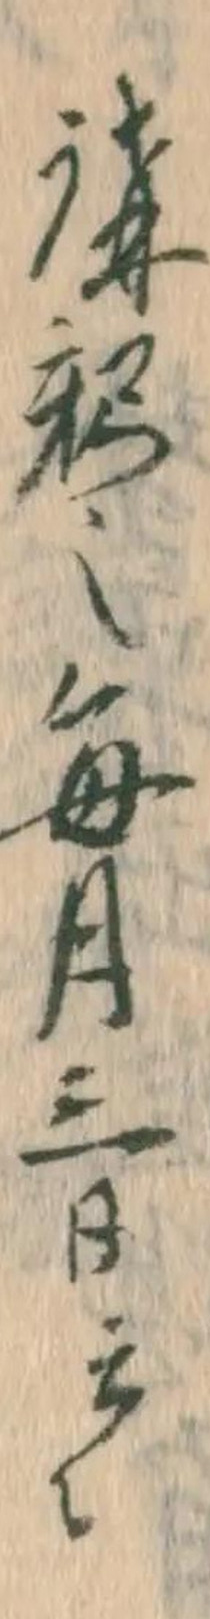講釈也毎月三日云々
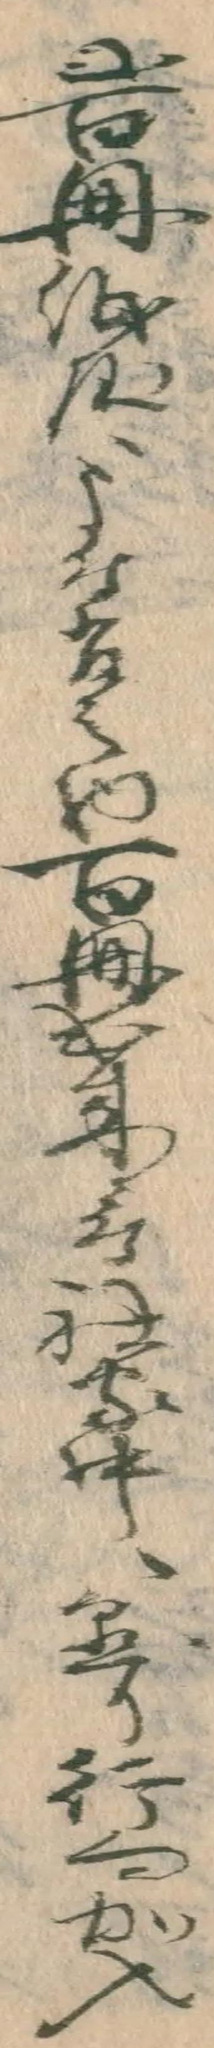弐百冊紙屋へ申付有之内百冊出来ニ付社家中へ懸り行向か入
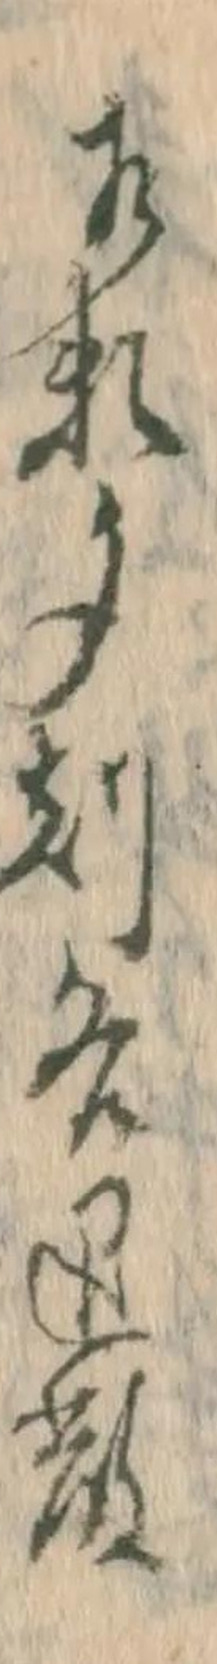相頼夕刻各退散
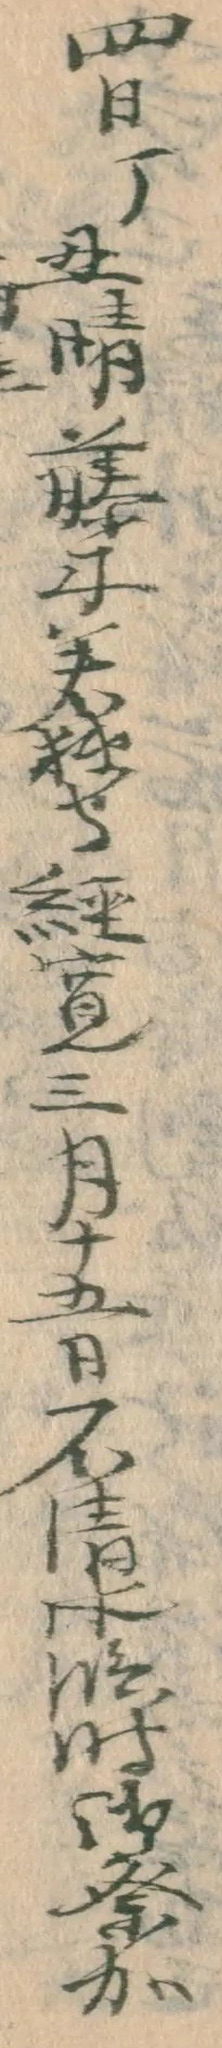四日丁丑晴藤木若狭守経寛三月十五日不清水臨時御祭加
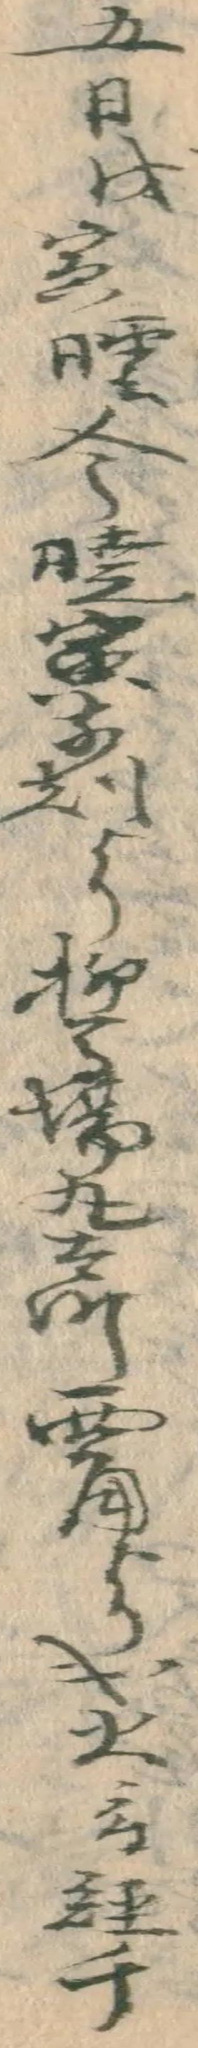五日戊寅曇今暁寅十半刻より柳馬場丸太町西角より出火ニ付経千
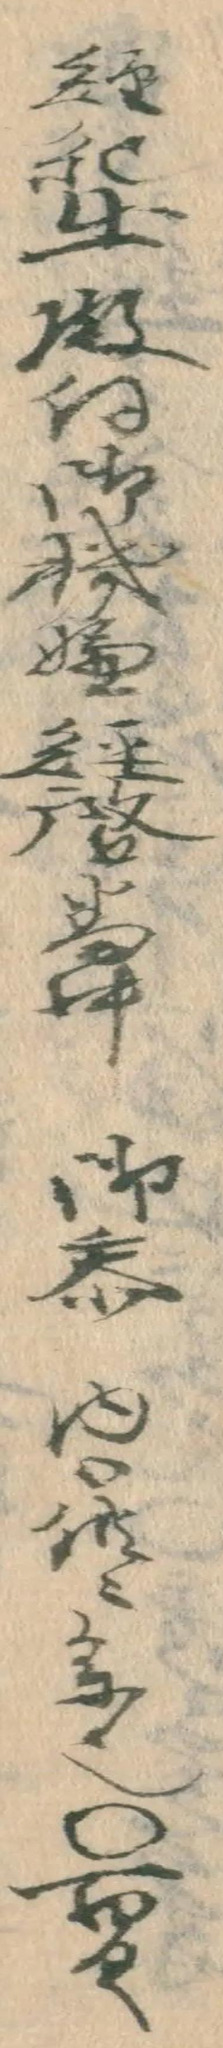経紀出殿伺御機嫌経啓番中御参内御供ニ参也○百匁
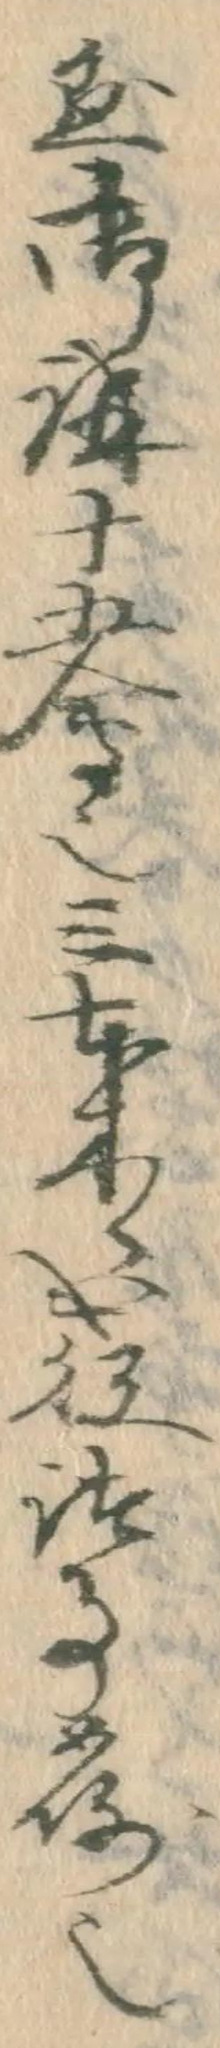懸御講十五會也三本木ヘ出役諸事如何也
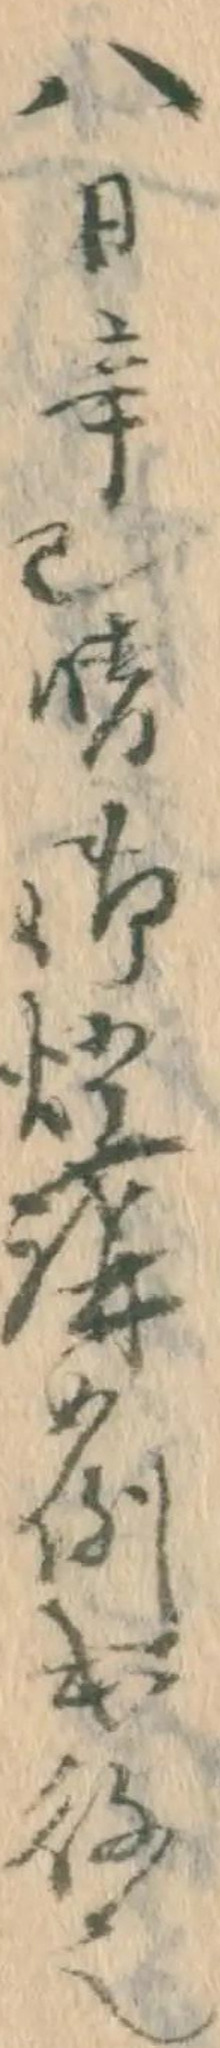八日辛巳晴御燈講如例出役也

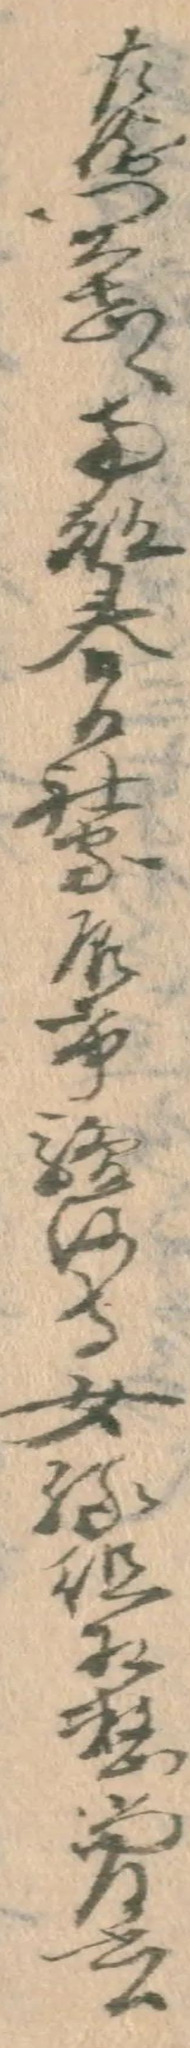左衛門大志へ南都春日社家辰市駿河寺女縁組相整當月六日
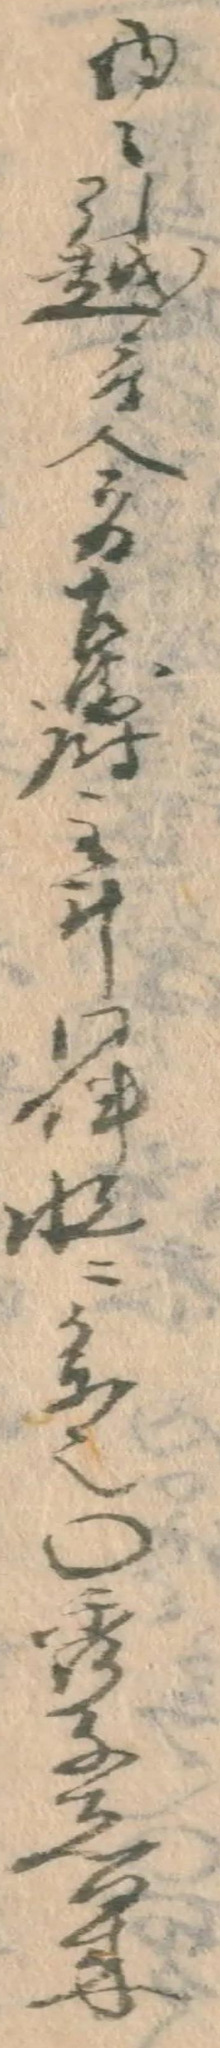内々引越ニ付今日左衛尉主斗同伴祝ニ参也○秀子先日来
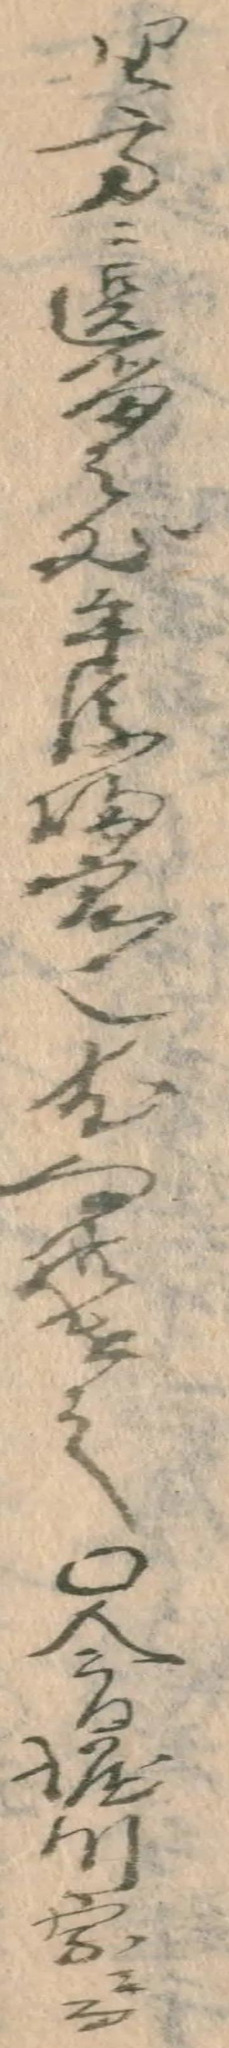里方ニ逗留之処午後帰宅也尤向供遣也○今日堀川家ニ而
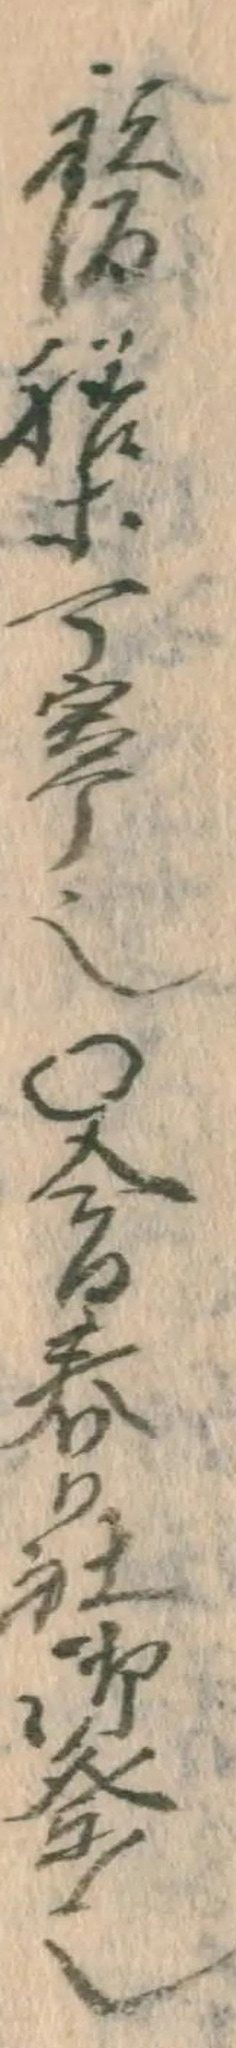祝酒膳等丁寧也○今日春日社御祭也
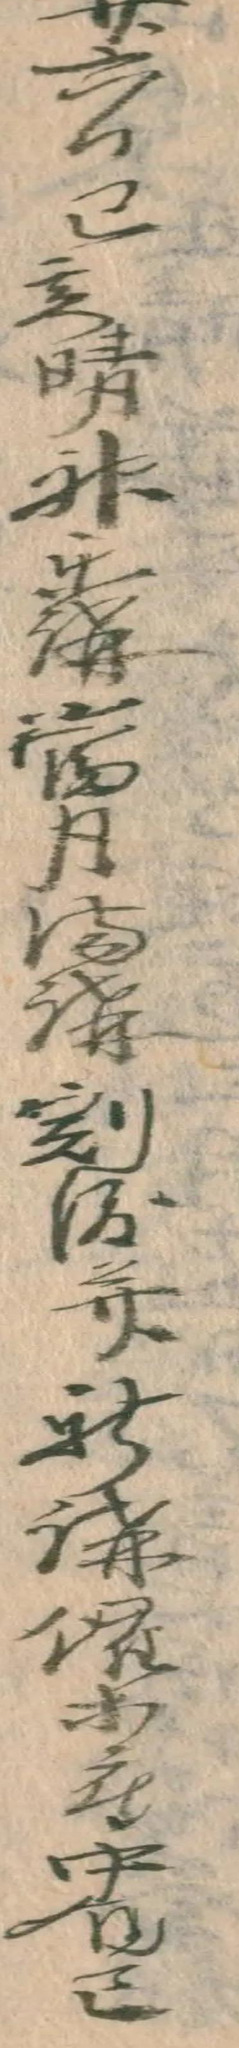廿六日己亥晴神楽講當月満講割渡幷新講催等ニ付中旬已
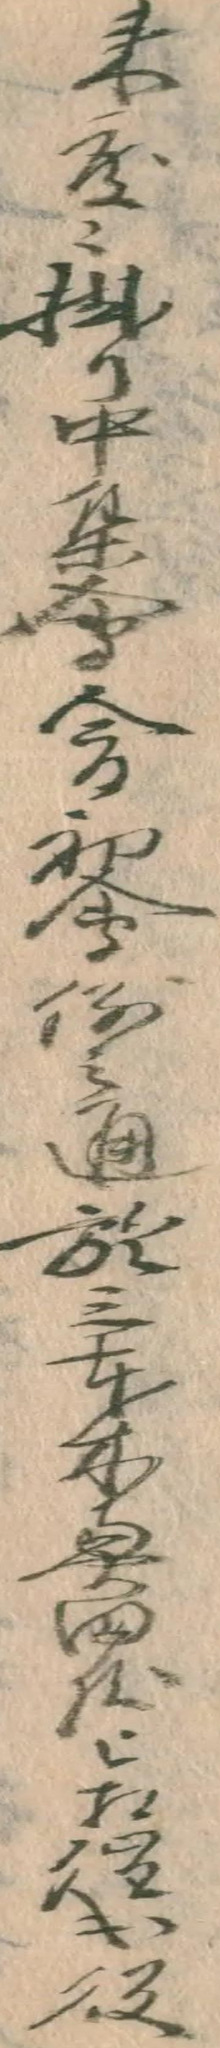来度御掛り中集會今日初會例之通於三本木奥田屋被相催出役
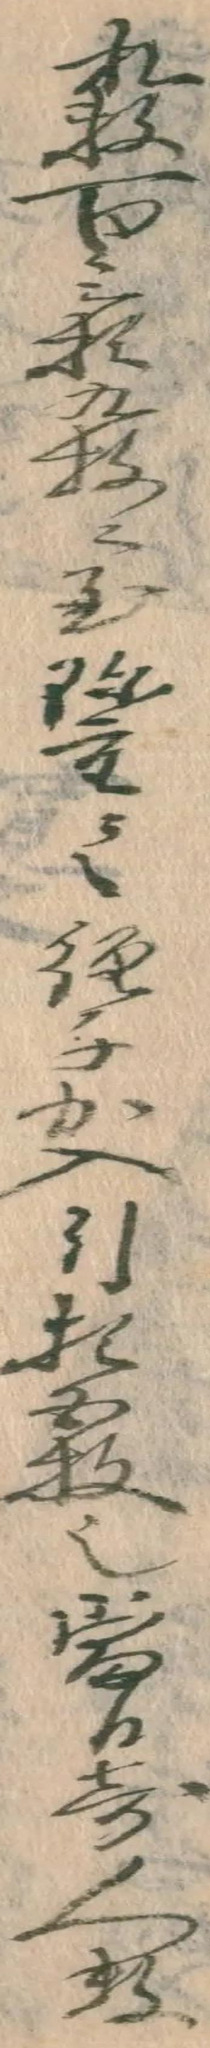札数百三拾九枚ニ至弥重々々経千加入引拾五枚也當日寄人数
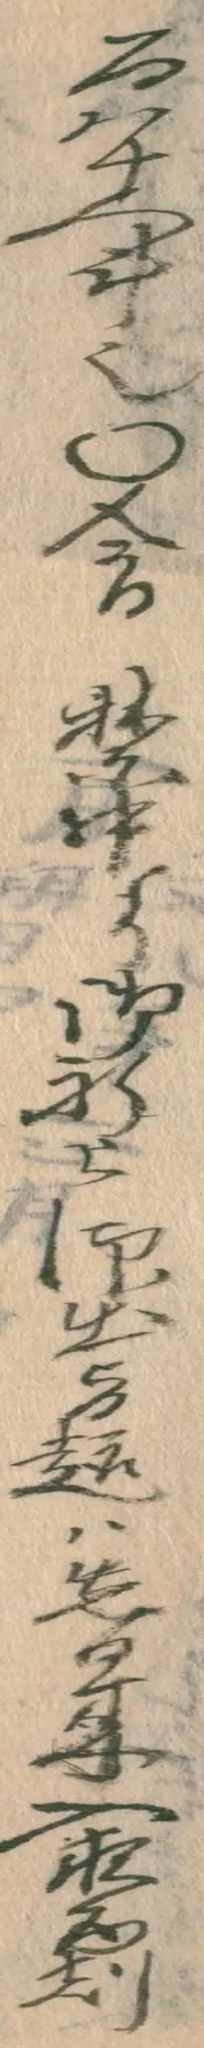百八十人斗也○今日禁中より御祈被仰出旨趣ハ先日来入夜酉刻
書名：賀茂社記録. 第69冊
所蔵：国立国会図書館 National Diet Library, JAPAN
